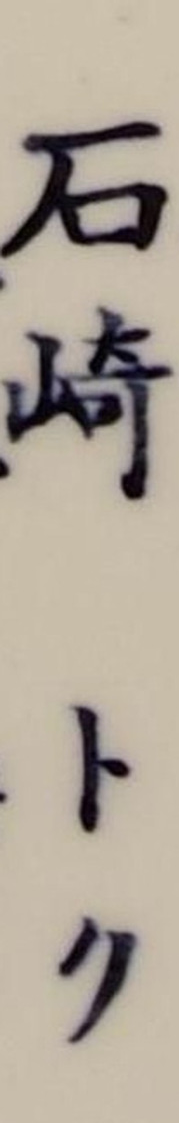石崎トク
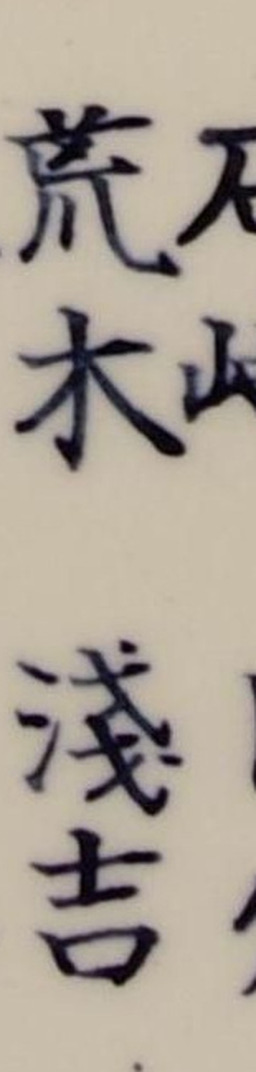荒木浅吉
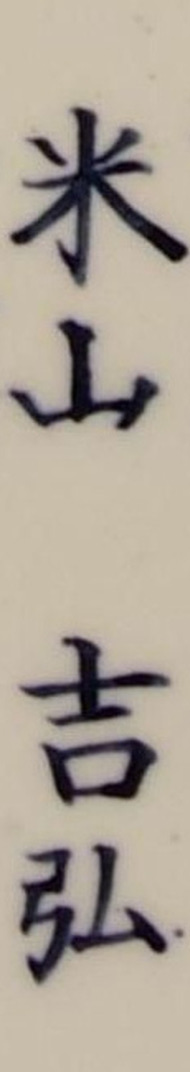米山吉弘
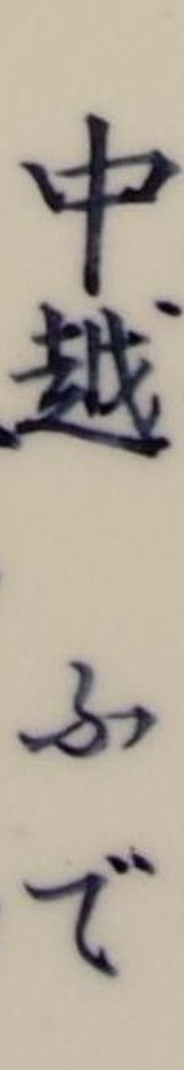中越ふで
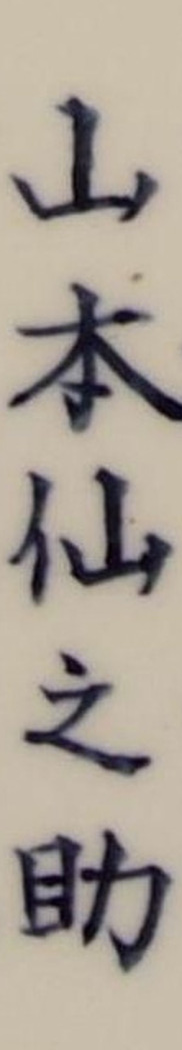山本仙之助
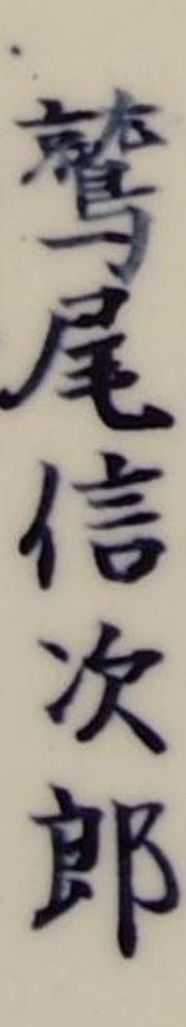鷲尾信次郎
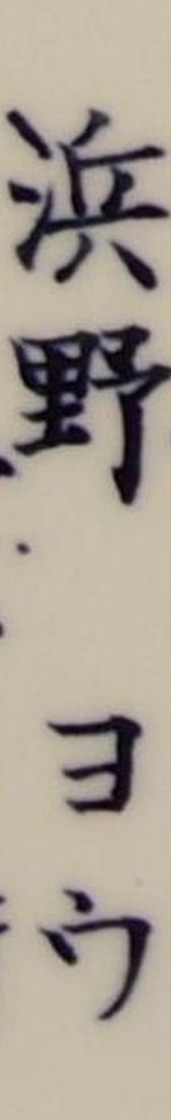浜野ヨウ
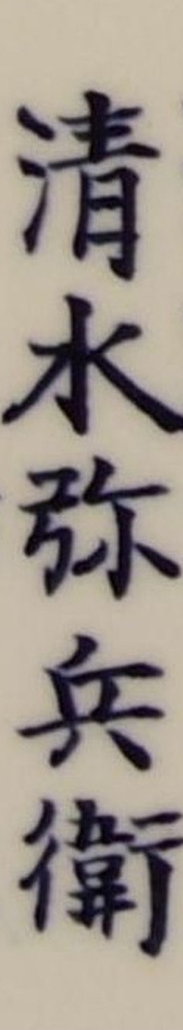清水弥兵衛
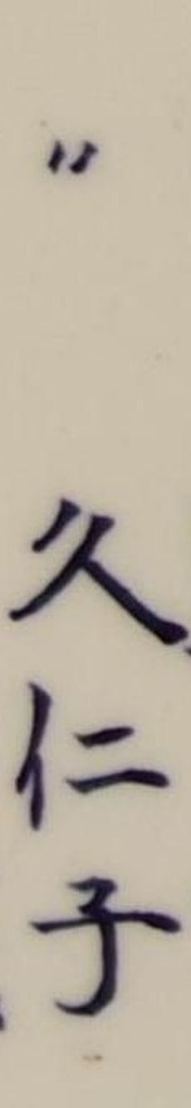久仁子
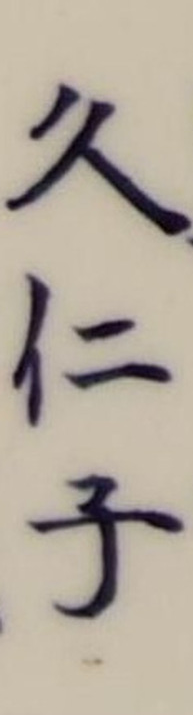久仁子
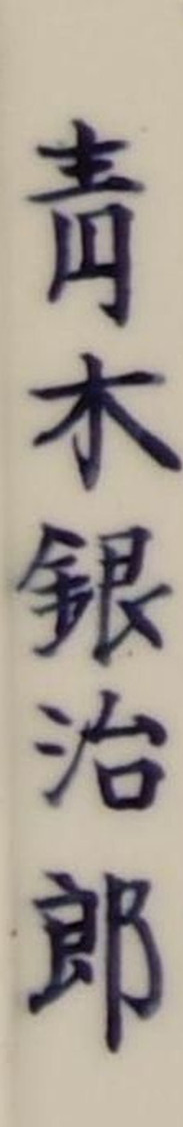青木銀治郎

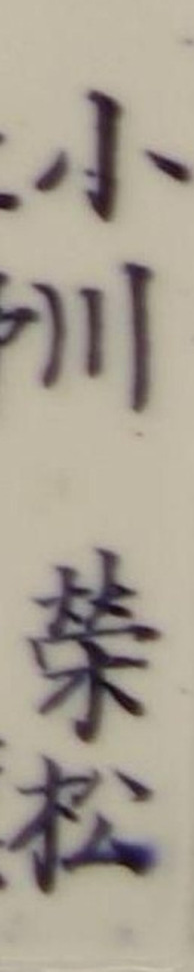小川榮松
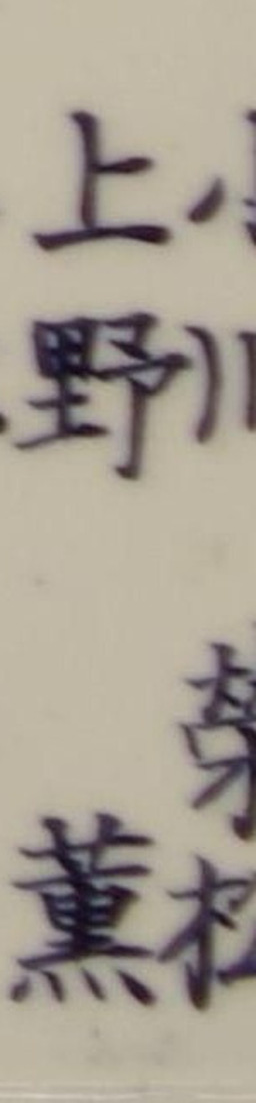上野薫
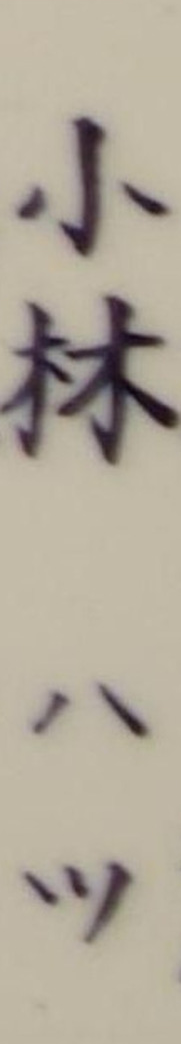小林ハツ
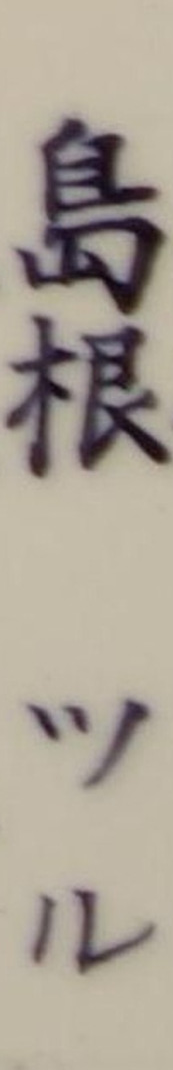島根ツル
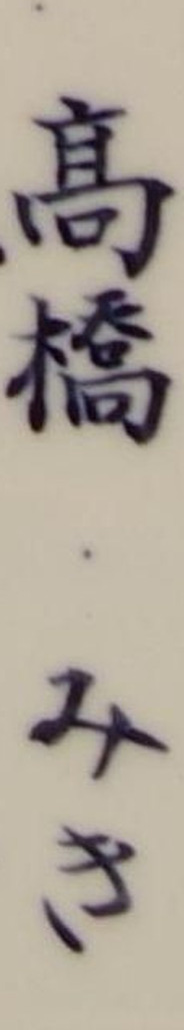高橋みき
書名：E~L
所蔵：高野山金剛峯寺
